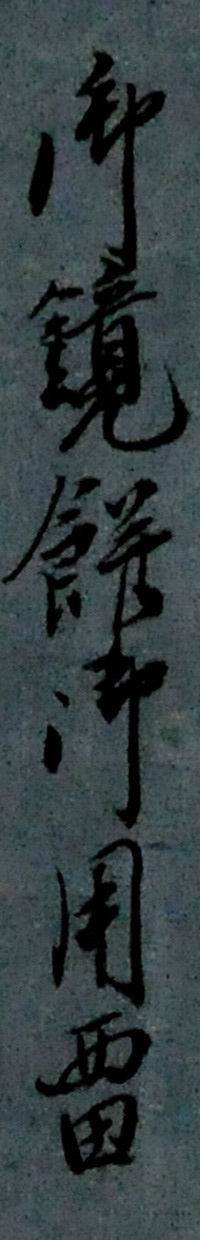御鏡餅御用留
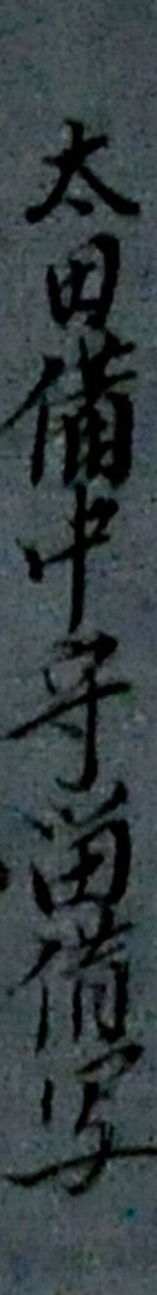太田備中守留借写
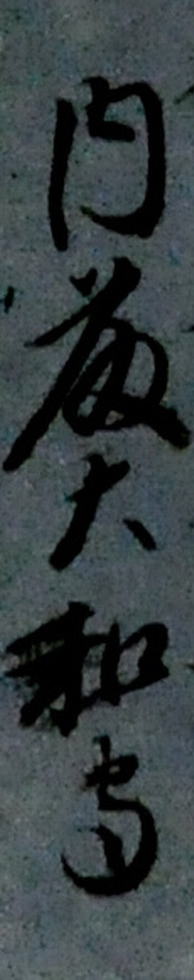内藤大和守

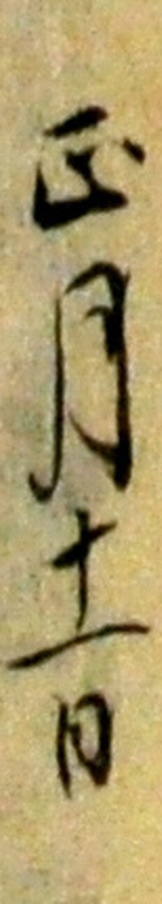正月十一日
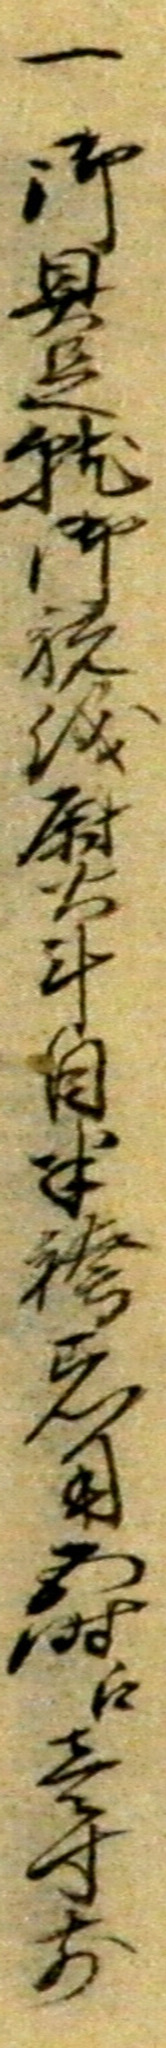一御具足就御祝儀熨斗目半袴着用五時え壱寸前
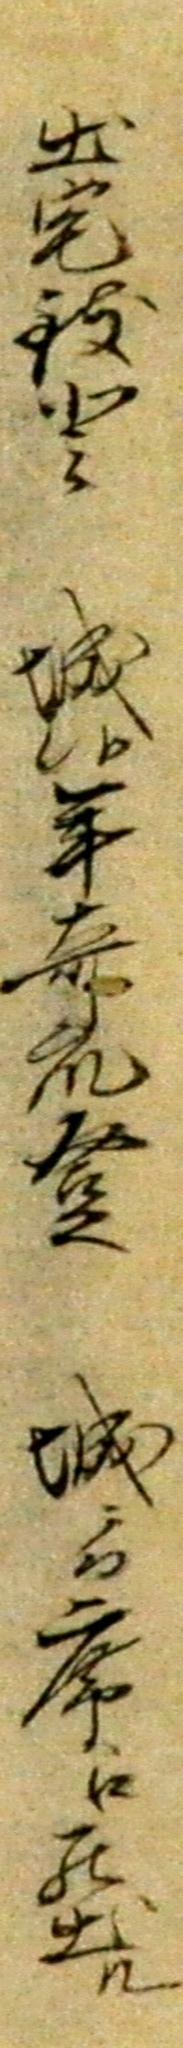出宅致登城候年寄衆登城ニ而席え罷出ル
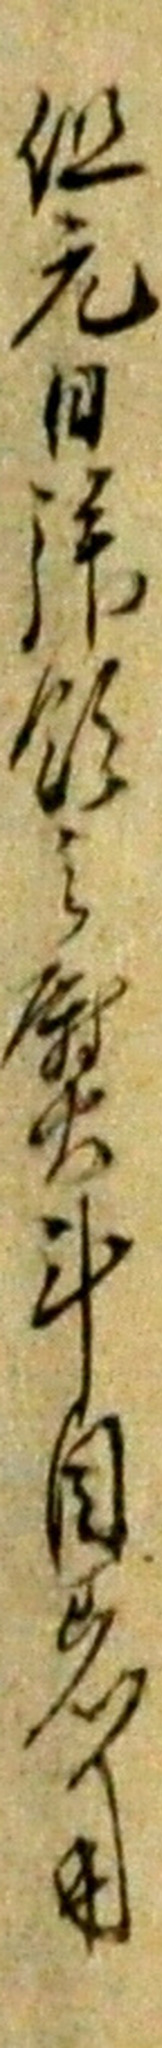但元日拝顔之熨斗目着用
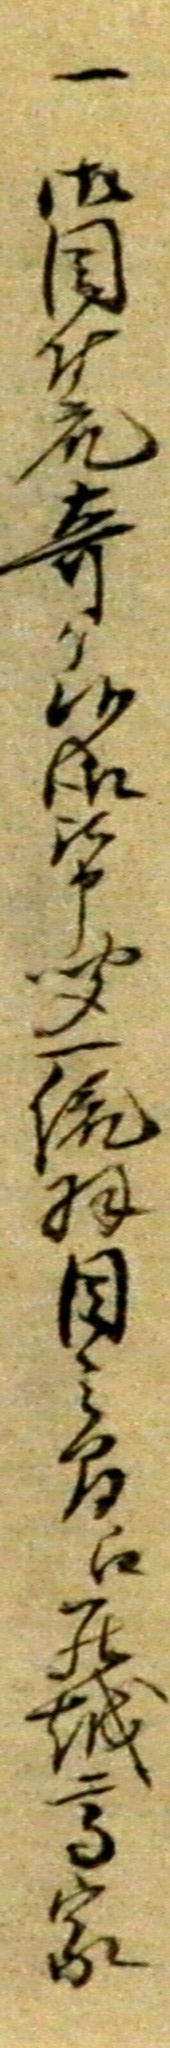一御目付衆寄り候様被申聞一統羽目之間え罷越高家
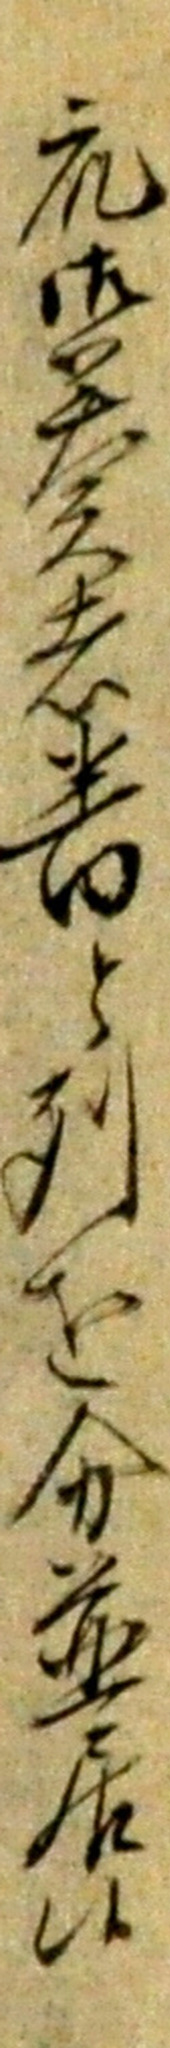衆御奏者番と列を分並居候
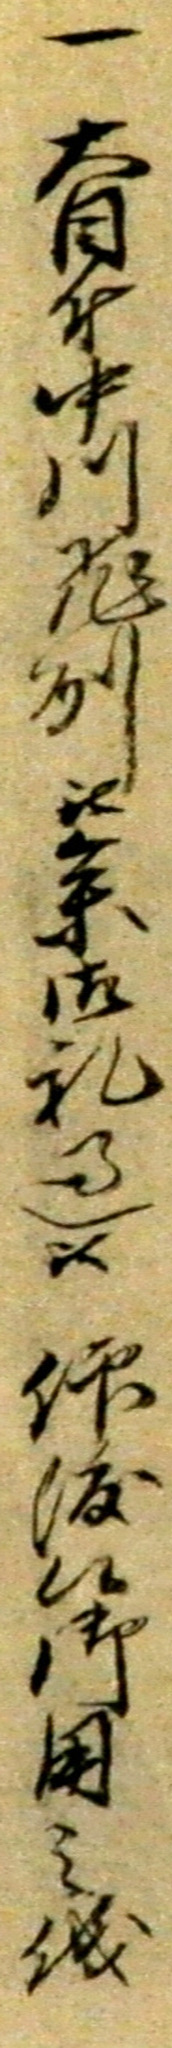一大目付中川飛州被参御礼過被仰渡候御用之儀

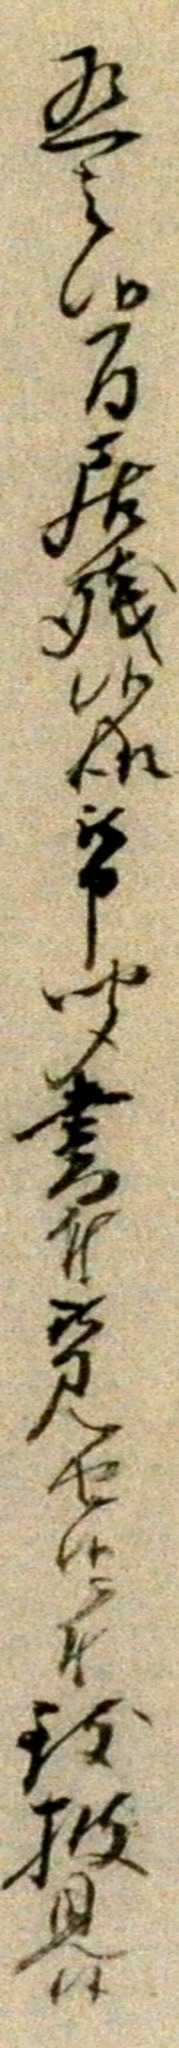有之候間居残候様被申聞書付被見セ候ニ付致披見候
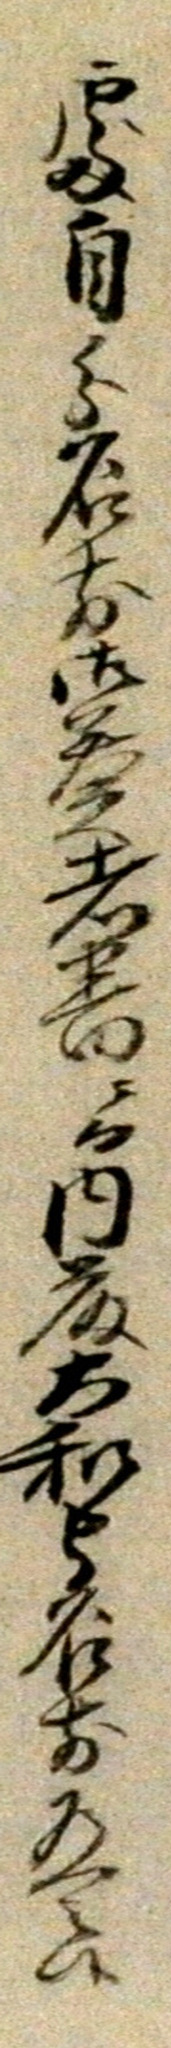処自分名前御奏者番ニ而内藤大和守名前有之候
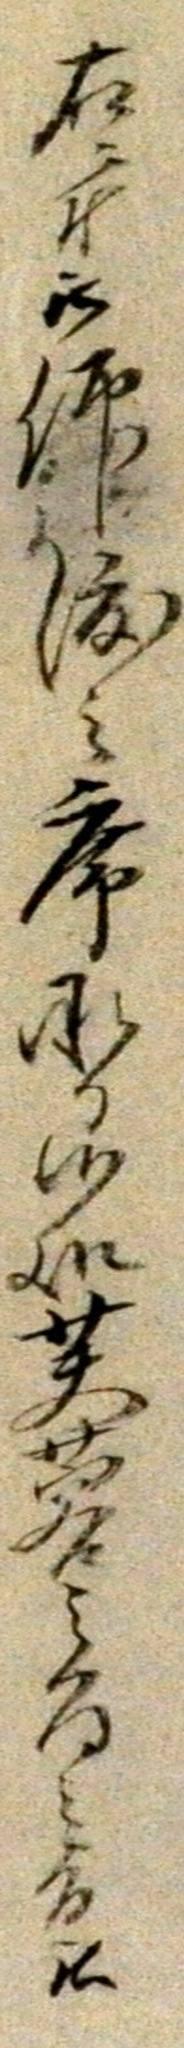右ニ付被仰渡之席承り候処芙蓉之間之旨被
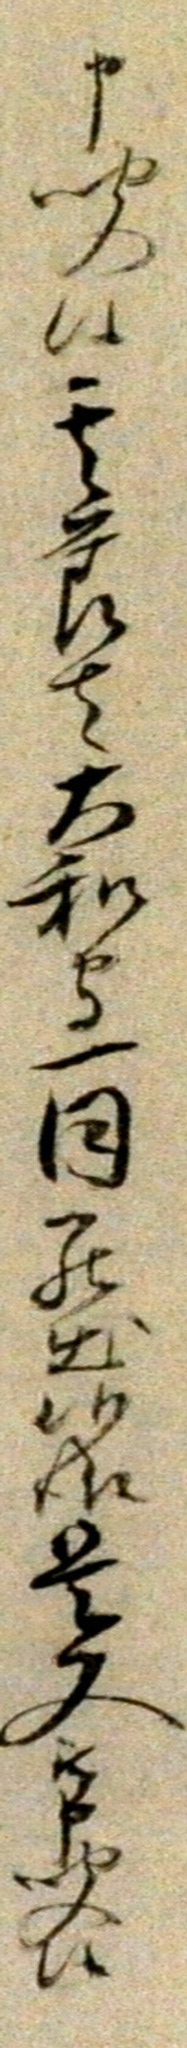申聞候其節は大和守一同罷出候様是又被申聞候
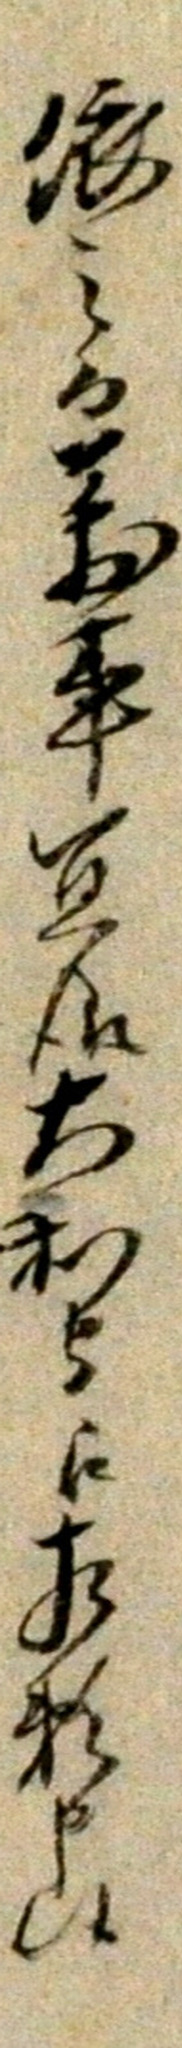依之而万事宜様大和守え相頼申候
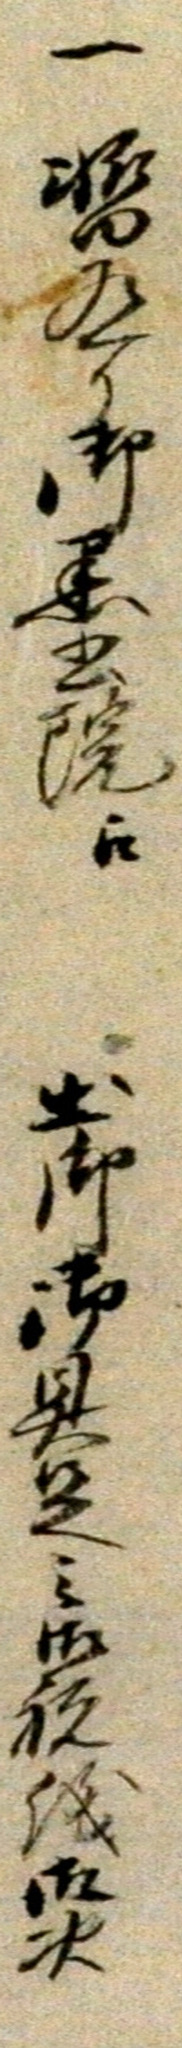一暫有り御黒書院え出御御具足之御祝儀御次
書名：御鏡餅御用留（写）
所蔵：伊那市立高遠町図書館・合同会社AMANE
